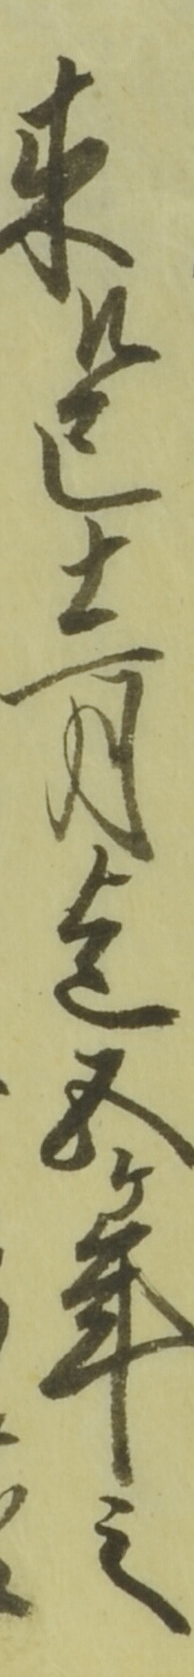来ル巳十二月迄五ヶ年之
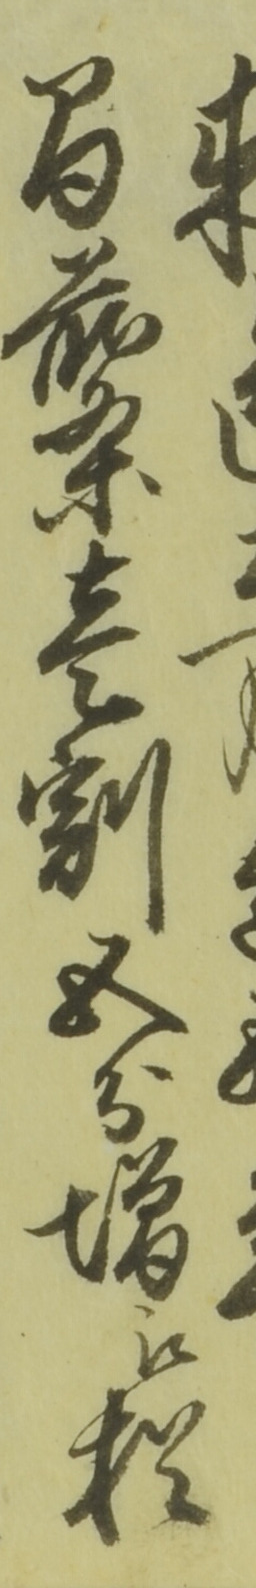間前条壱割五分増猶
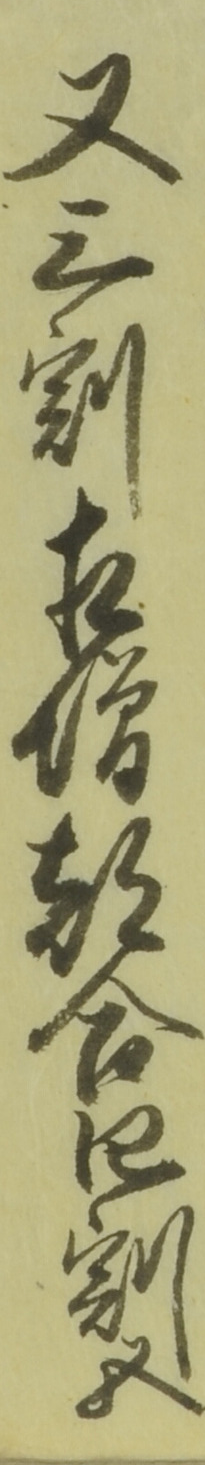又三割相増都合四割五
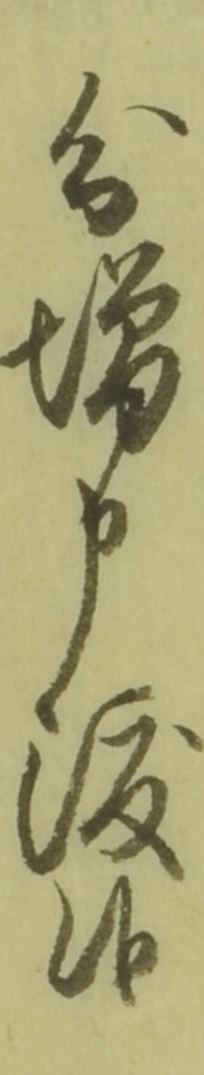分増申渡候

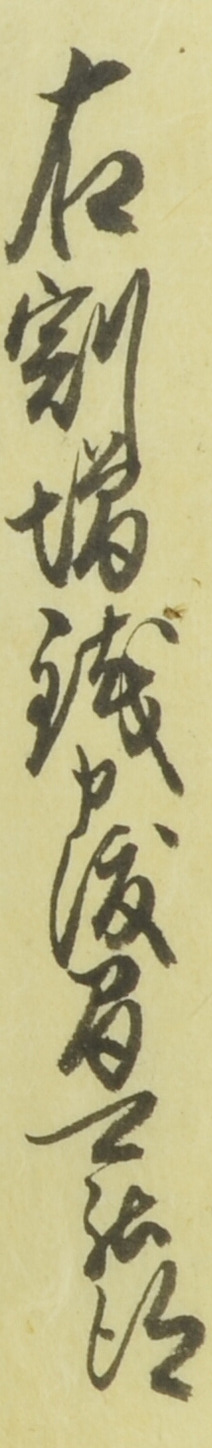右割増銭申渡間可被得
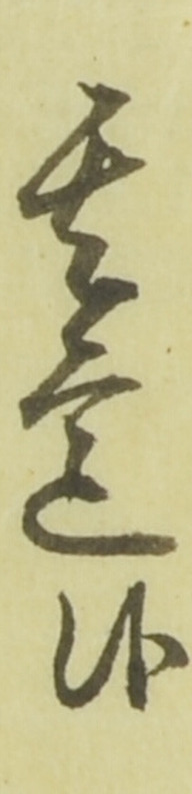其意候
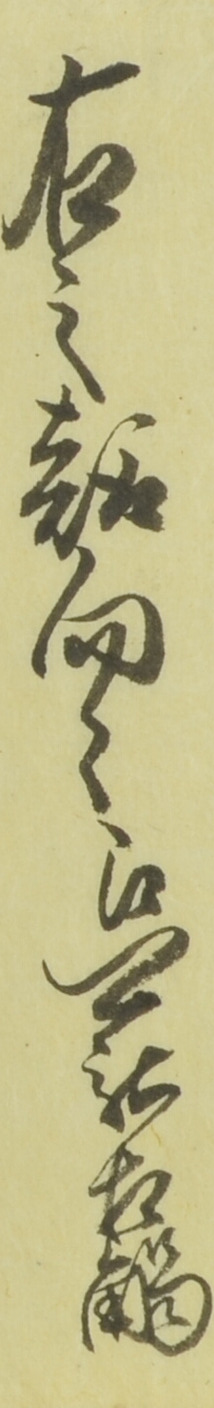右之趣向々江可被相触
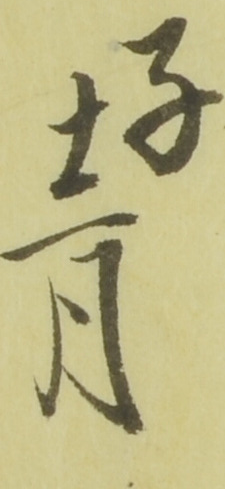十二月
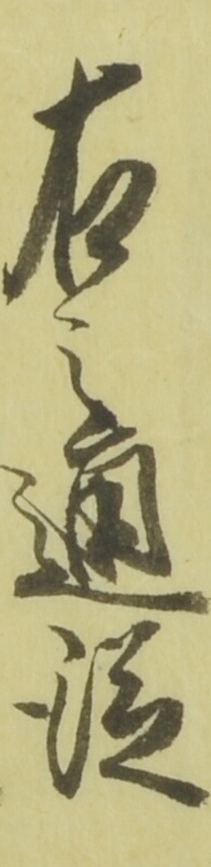右之通従
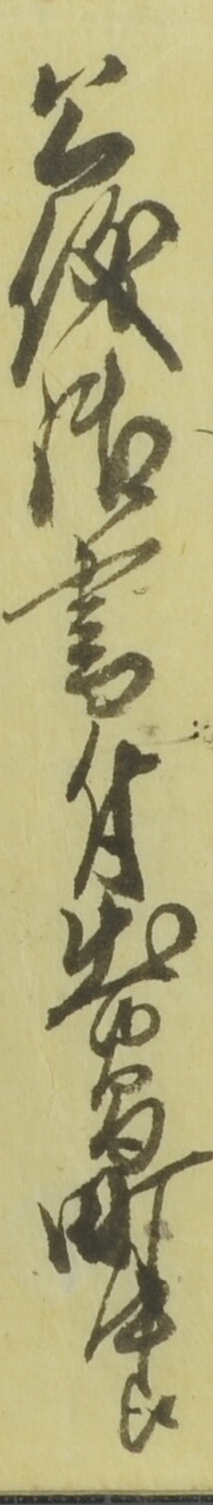公儀御書付出候間町中江
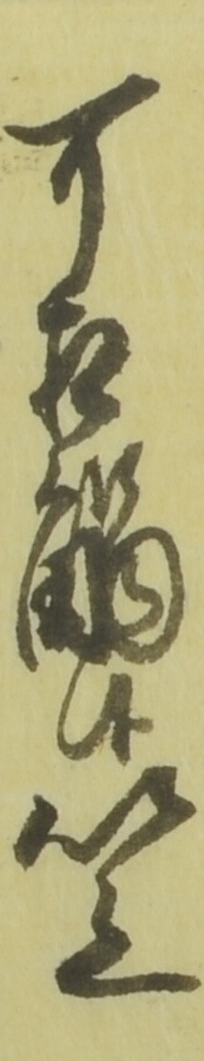可相触候以上
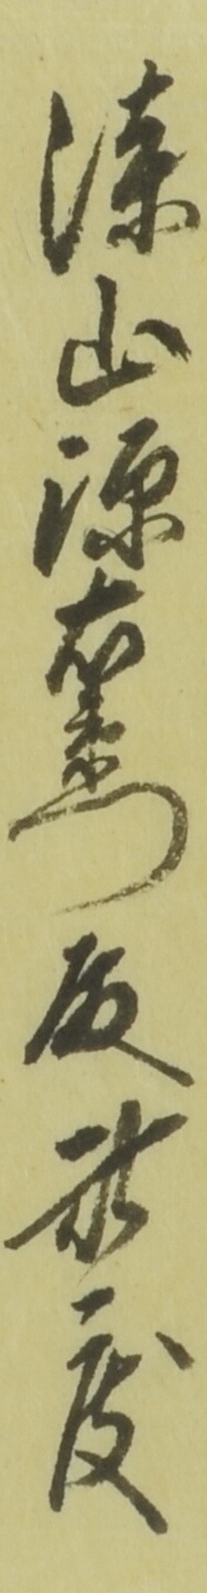漆山源右衛門殿此度
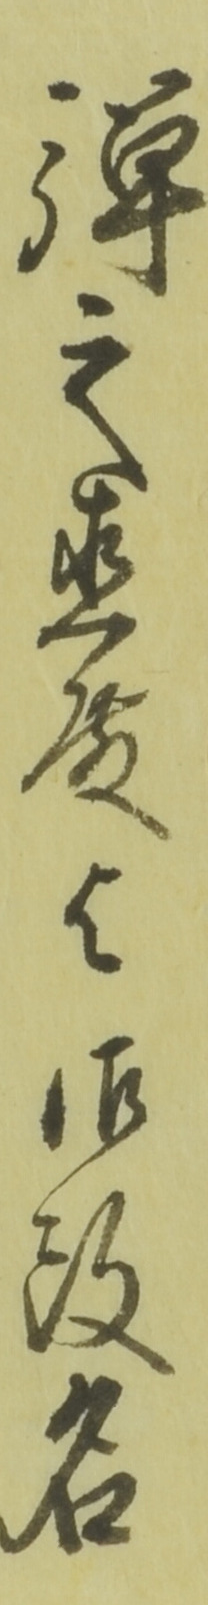弾之丞殿と御改名
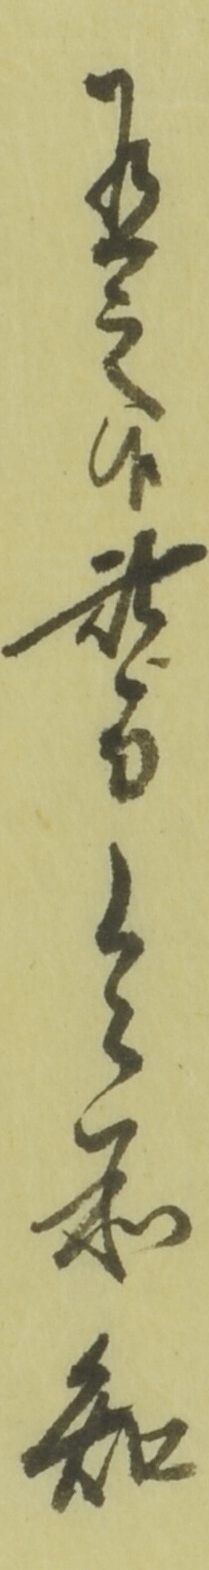有之候此方令承知
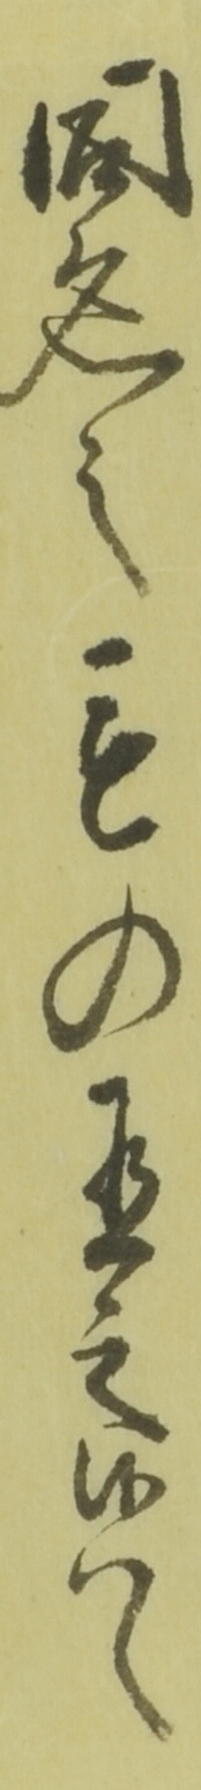同名之もの有之候ハヽ
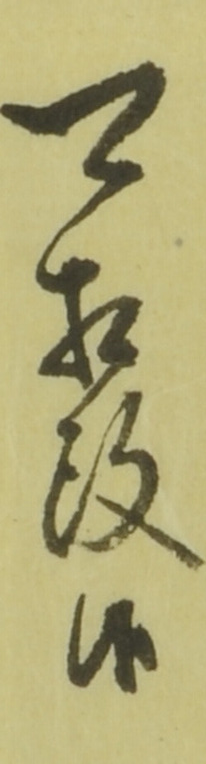可相改候
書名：御触書御書附控
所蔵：伊那市立高遠町図書館・合同会社AMANE
